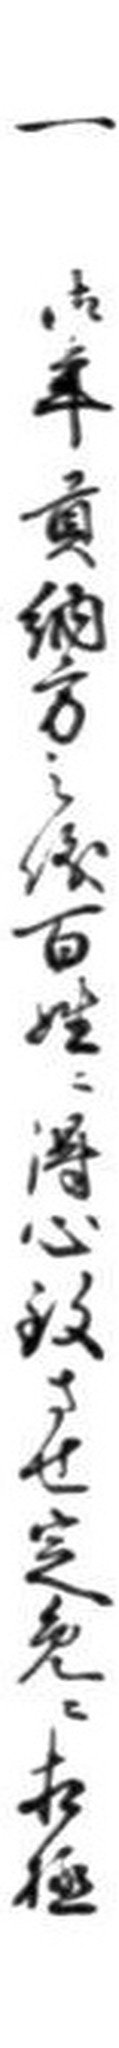一御年貢納方之儀百姓ニ得心致させ定免ニ相極
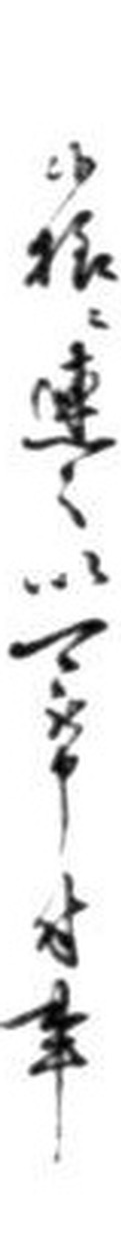候様ニ連々以可被申付事
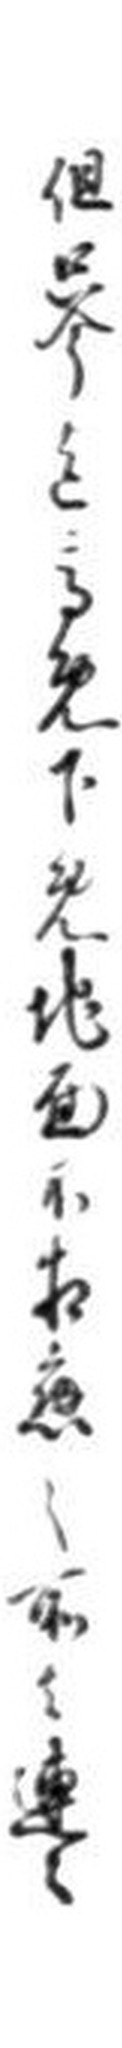但只今迄高免下免地面不相応之所者連々
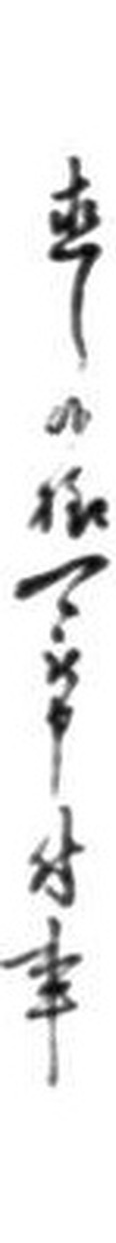直し候様可被申付事
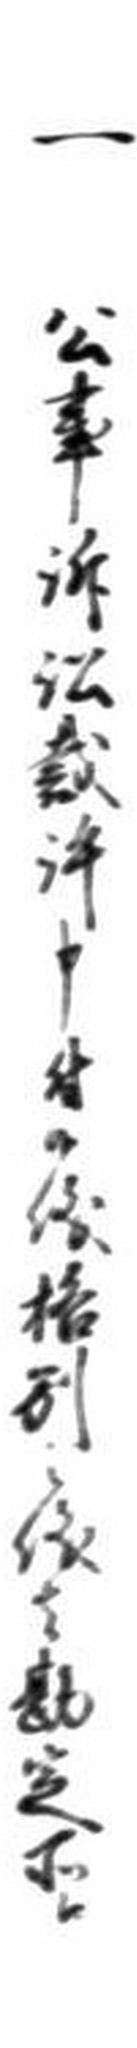一公事訴訟裁許申付候儀格別之儀者勘定所江
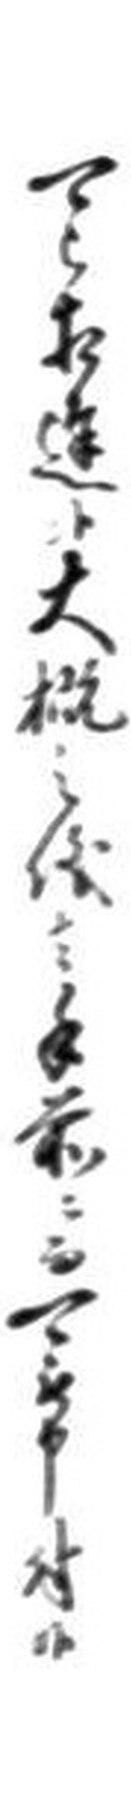可被相達候大概之儀者手前ニ而可被申付候
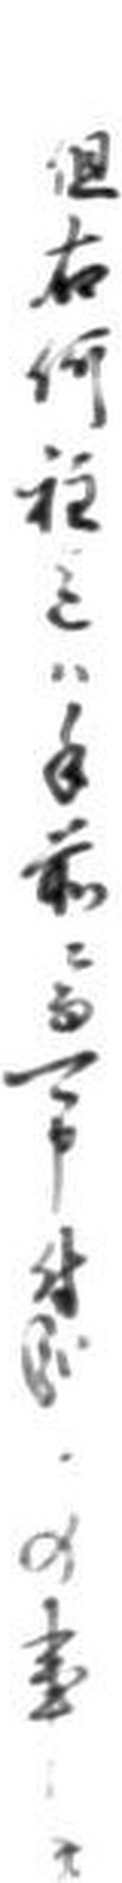但右何程迄ハ手前ニ而可申付哉との事并
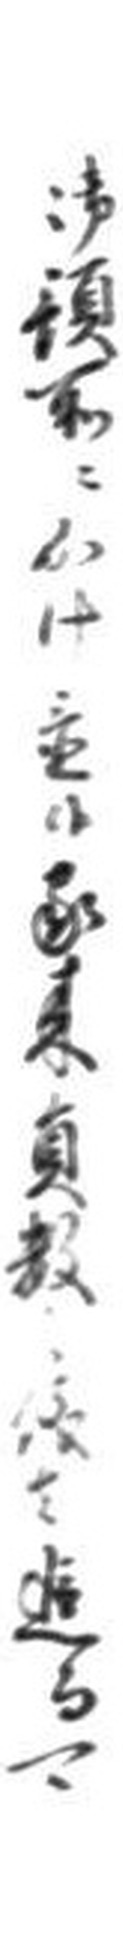御預所ニかけ置候家来員数之儀者追而可
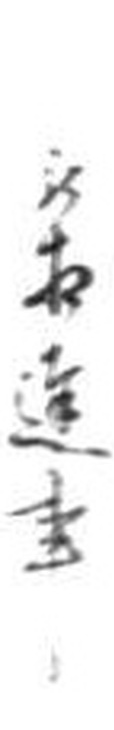被相達事
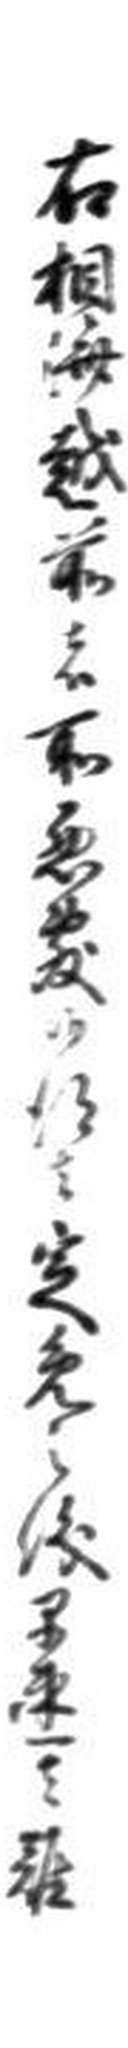右相済越前者所悪敷候得者定免之儀早速者難
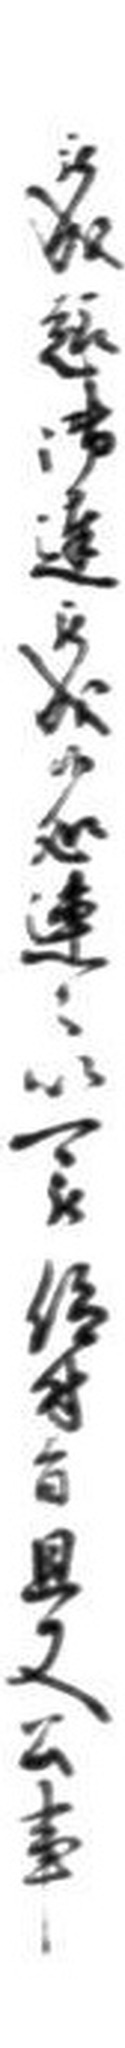被成趣御達被成候処連々以可被仰付旨且又公事

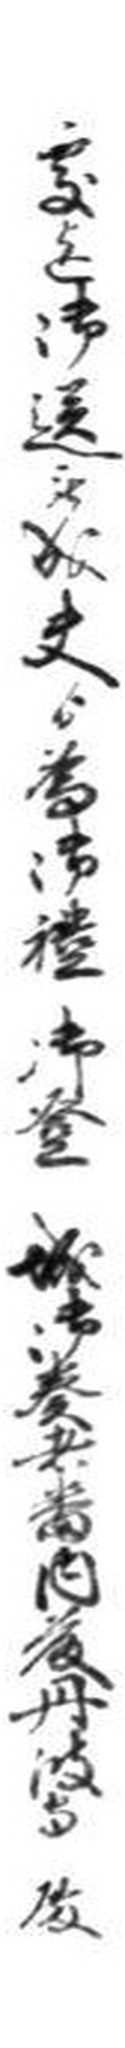處迄御送被成剃れ夫ゟ為御礼御登城御奏者番内藤丹後守
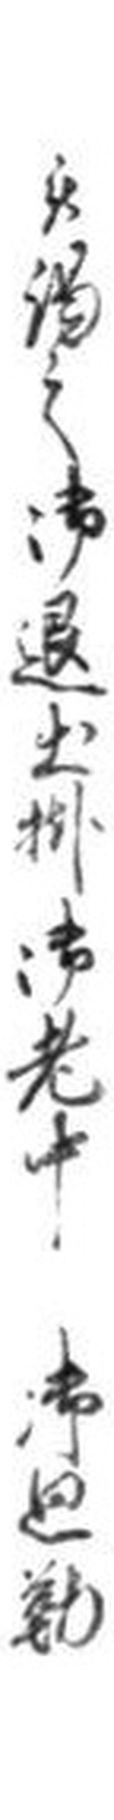被謁之御退出掛御老中御廻勤
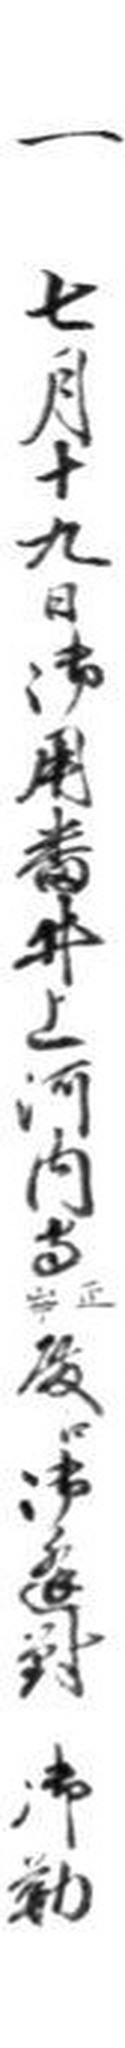一七月十九日御用番井上河内守正殿江御逢対御勤
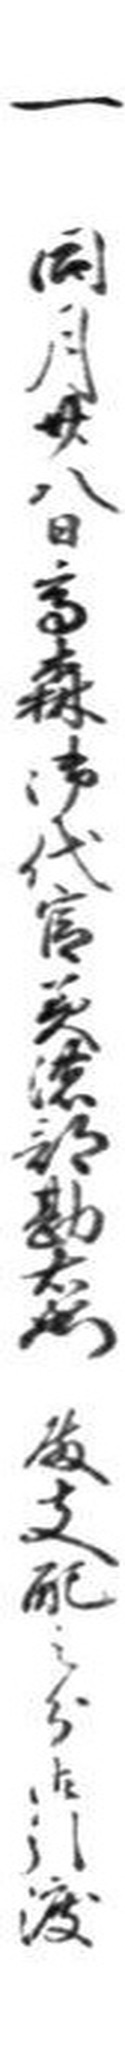一同月廿八日高森御代官美濃部勘右エ門殿支配之分御引渡
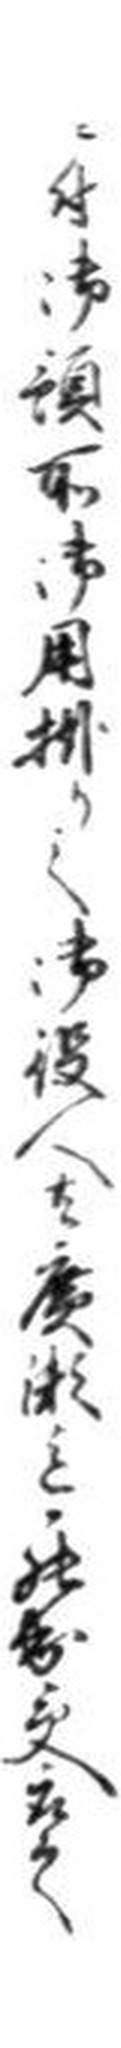ニ付御領所御用掛り之御役人共廣瀬迄罷出受取之
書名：家譜 三十四 吉邦公 従享保五年到同六年
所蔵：福井県文書館 Fukui Prefectural Archives
